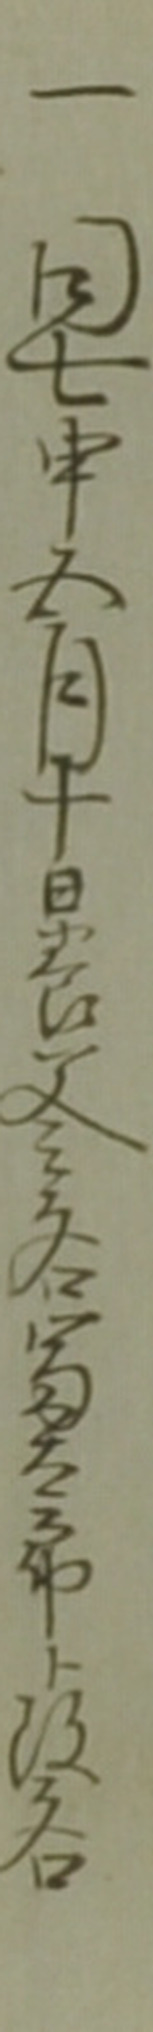一同七申五月十日養父之名冨太郎ト改名
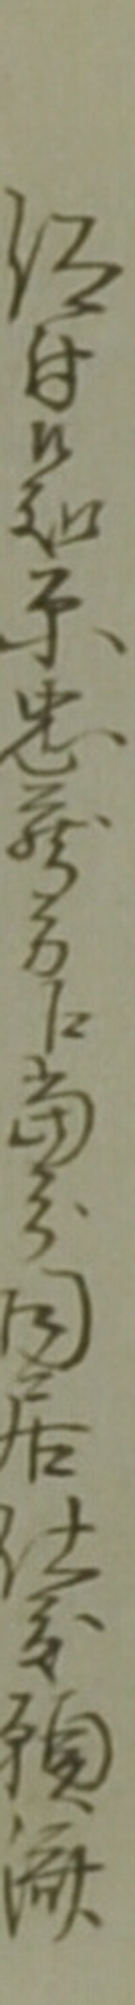仰付候処原忠蔵方江当分同居仕度願済
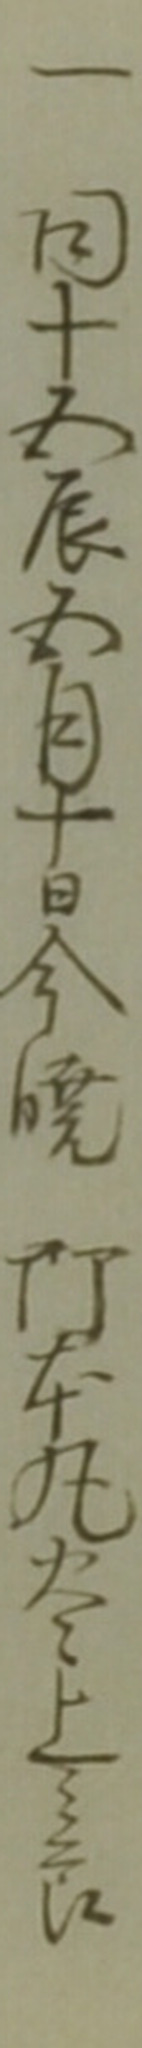一同十五辰五月十日今暁御本丸炎上之節
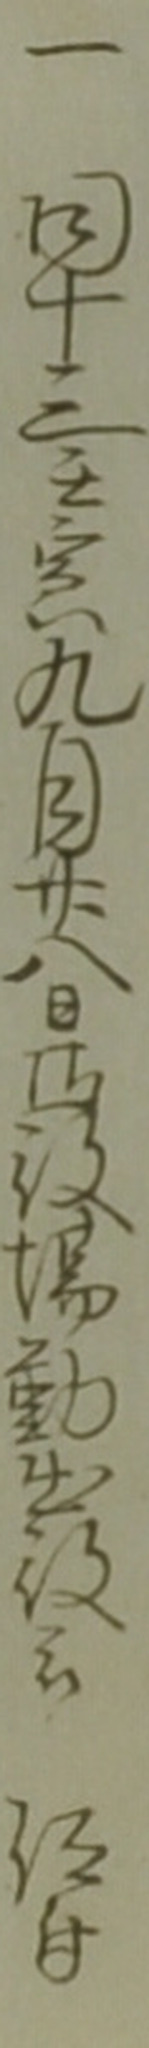一同十三壬寅九月廿八日御役場勤出役被仰付
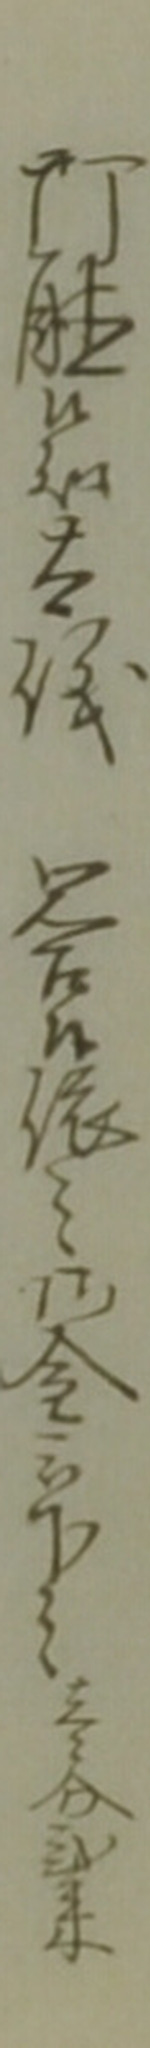御聴候処太儀思召候依之御金被下之壱分弐朱
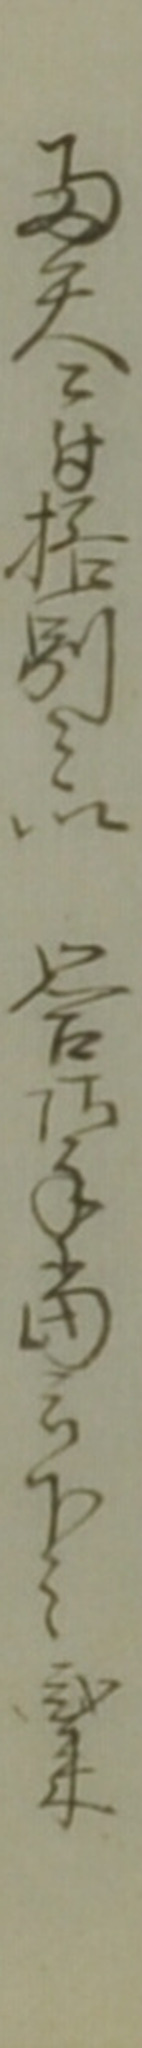雨天ニ付格別之以思召御手当被下之弐朱
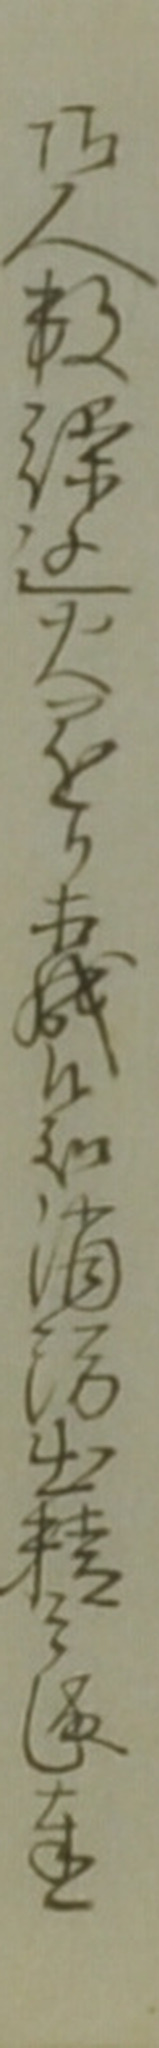御人数繰込火懸リ相成候処消防出精之趣達
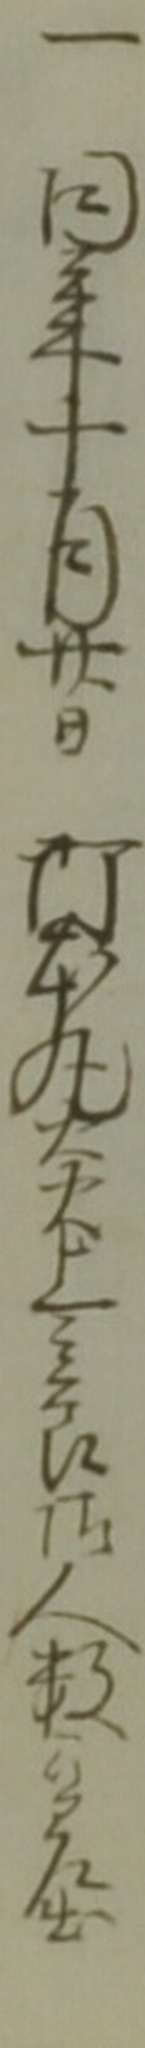一同年十月廿日御本丸炎上之節御人数被差出
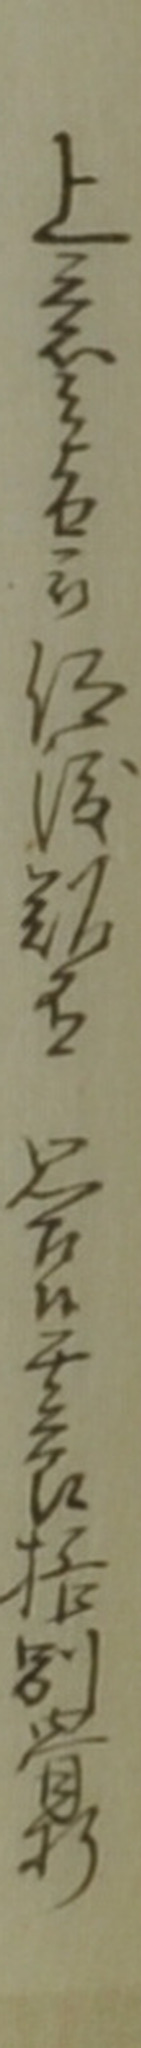上意之旨被仰渡難有思召候其節格別骨折
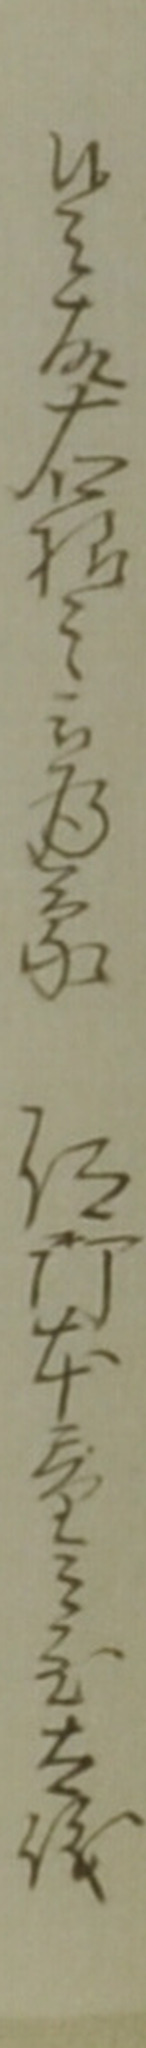候之故右様之被為蒙仰御本望之至太儀
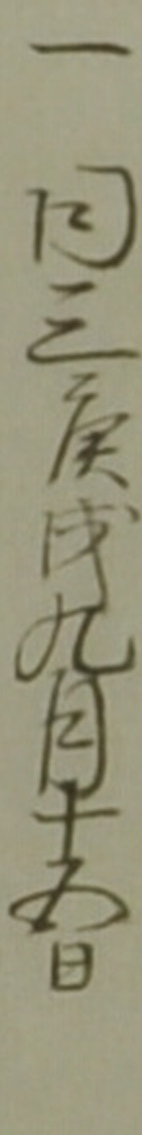一同三庚戌九月十五日

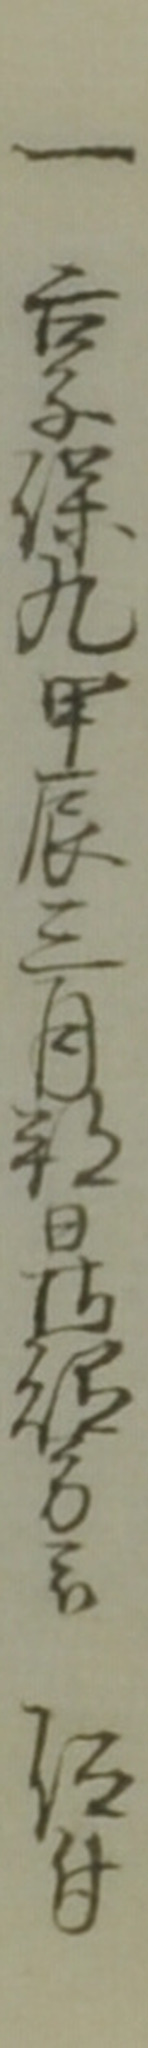一享保九甲辰三月朔日御賄方被仰付
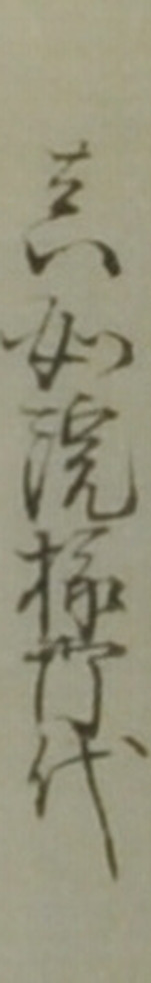真如院様御大
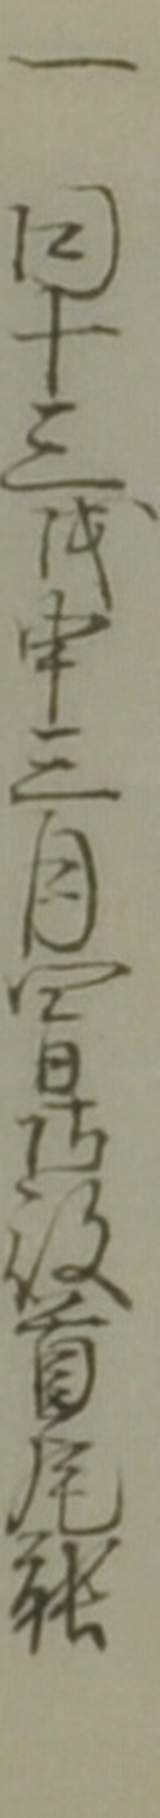一同十三戊申三月四日御役首尾能
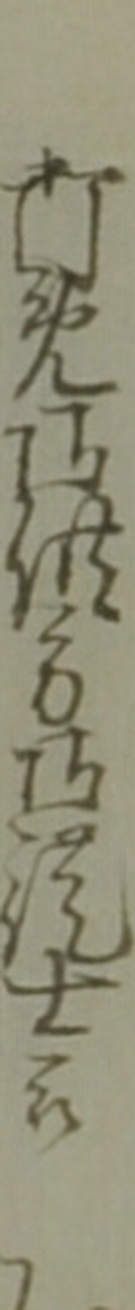御免御供方御徒士被仰付
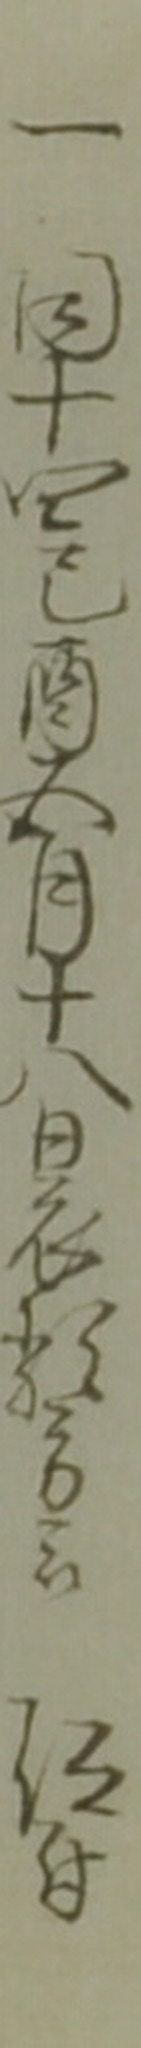一同十四己酉五月十八日衣類方被仰付
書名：無足諸士勤仕録（一）
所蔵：伊那市立高遠町図書館・合同会社AMANE
